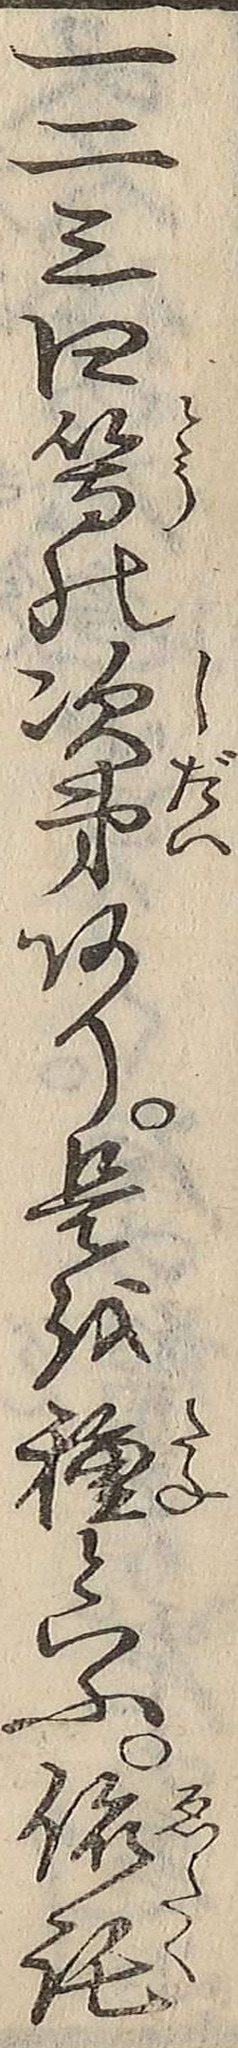一二三四等の次第あり。是を種といふ。依託
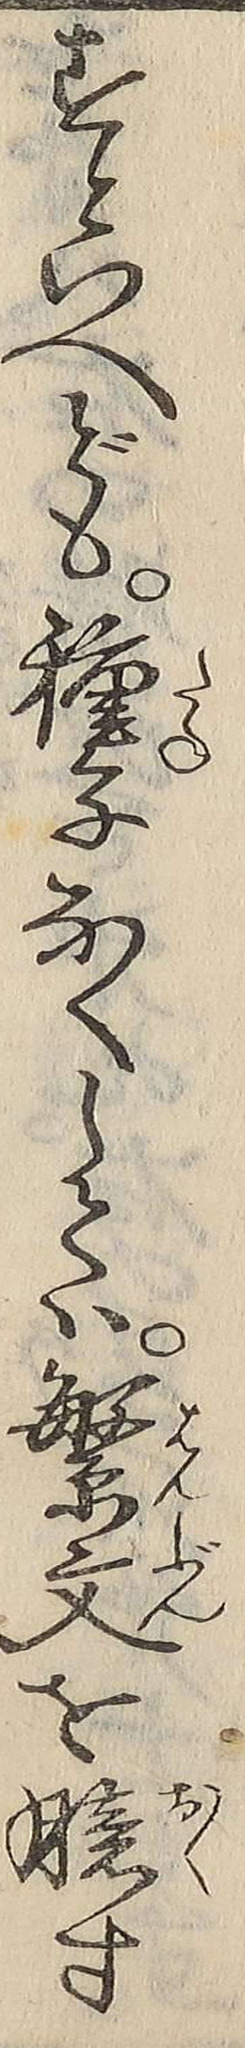すといへども。種子なくしては。繁文を臆す
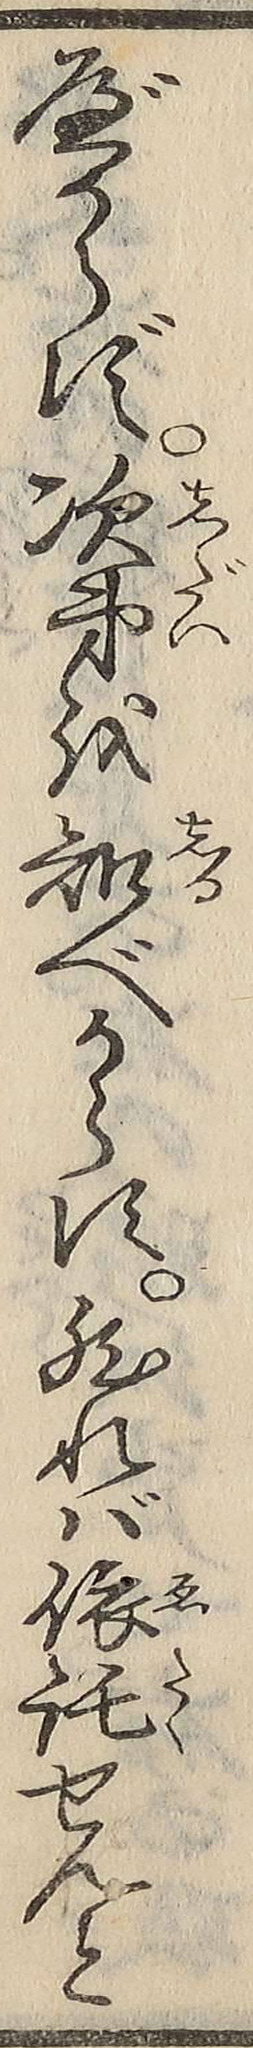べからず。次第を知べからす。然れば依託せんと
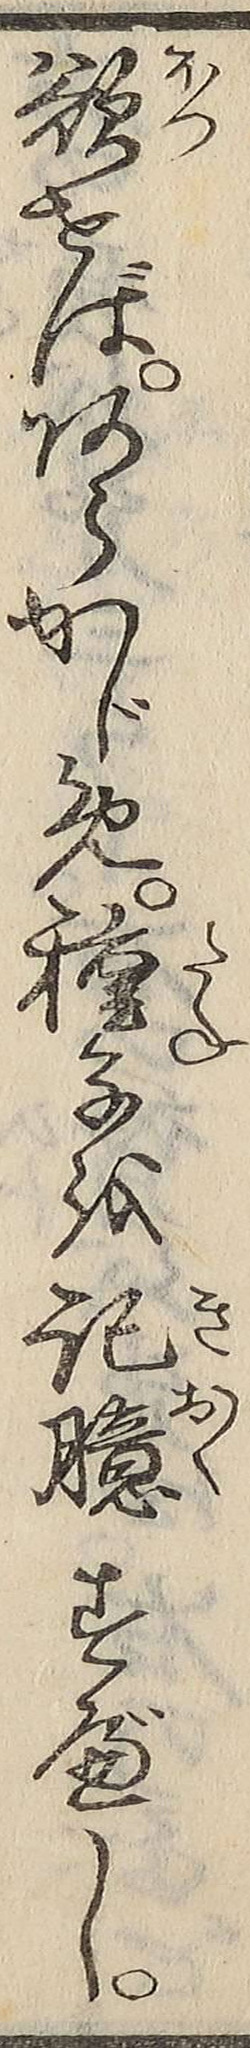欲せば。あらかじめ。種子を記臆すべし。
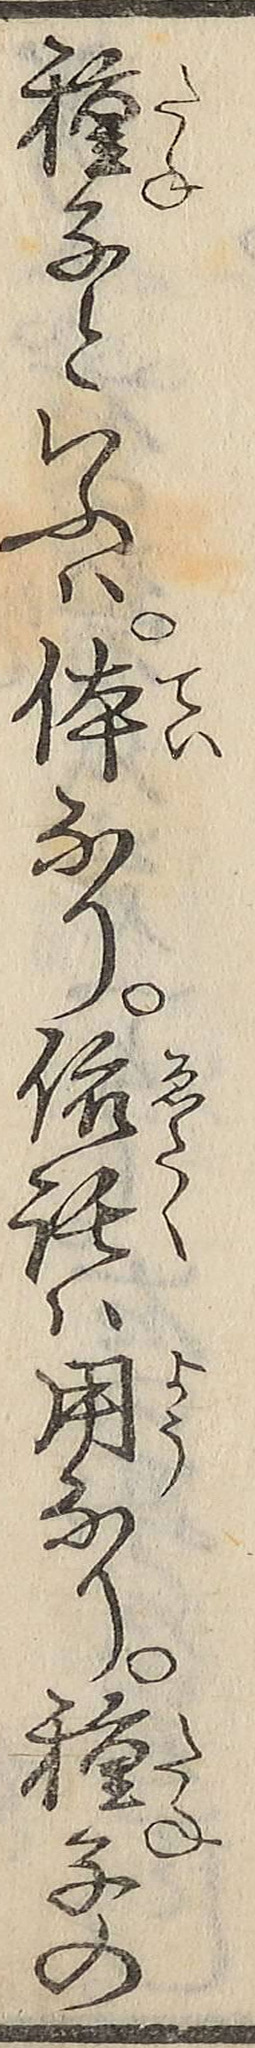種子といふは。体なり。依託は用なり。種子の
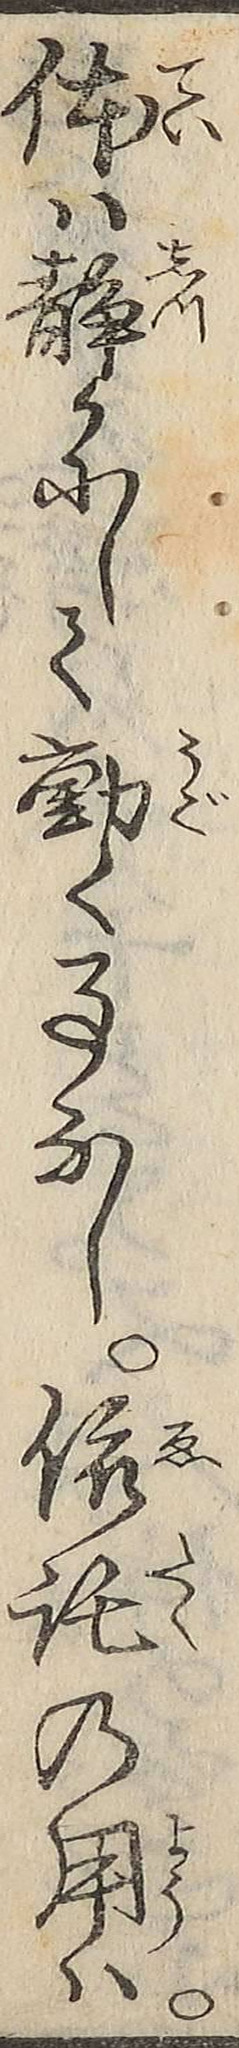体は静かにして動く事なし。依託の用は。
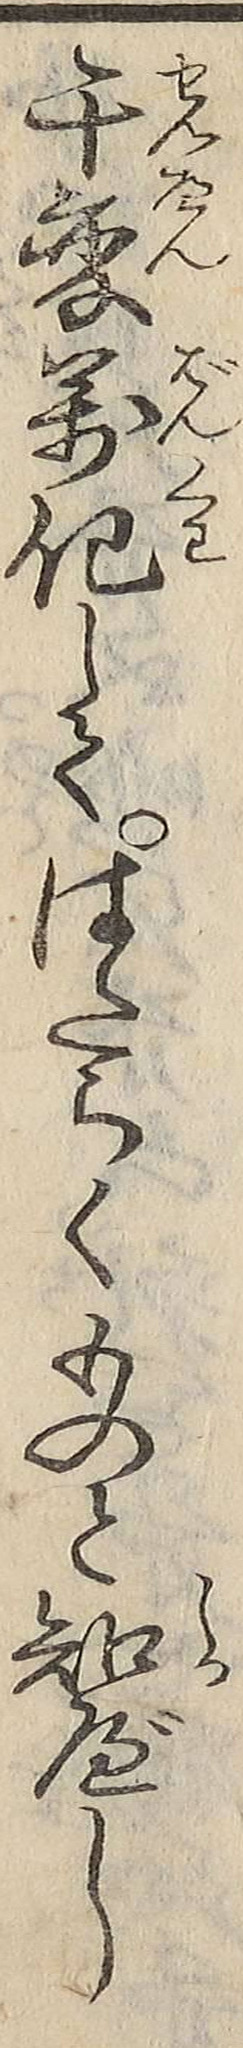千変万化して。はたらくものと知べし
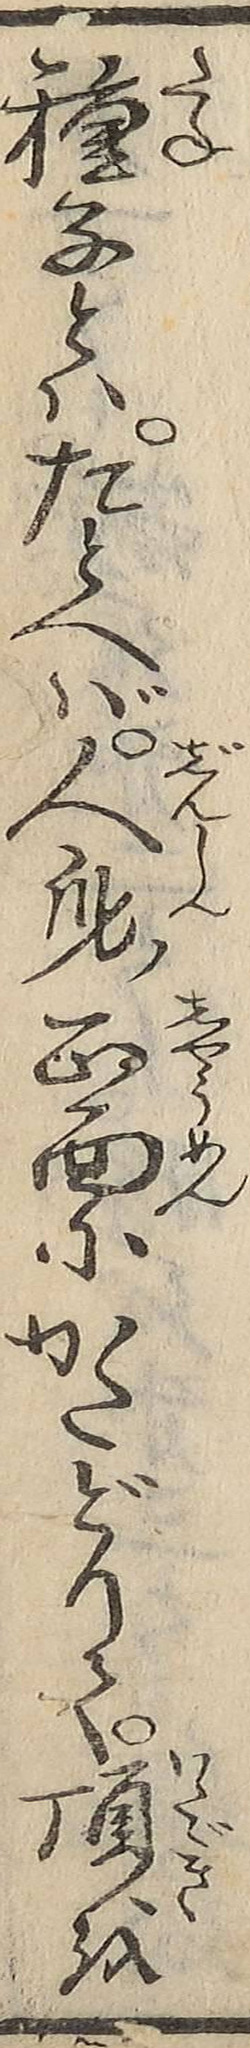種子とは。たとへば。人身の正面にかたどりて。頂を

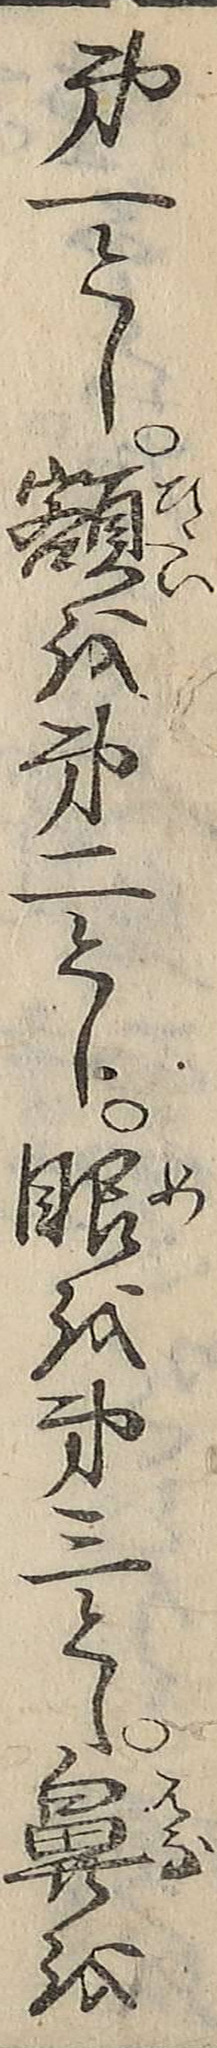第一とし。額を第二とし。眼を第三とし。鼻を
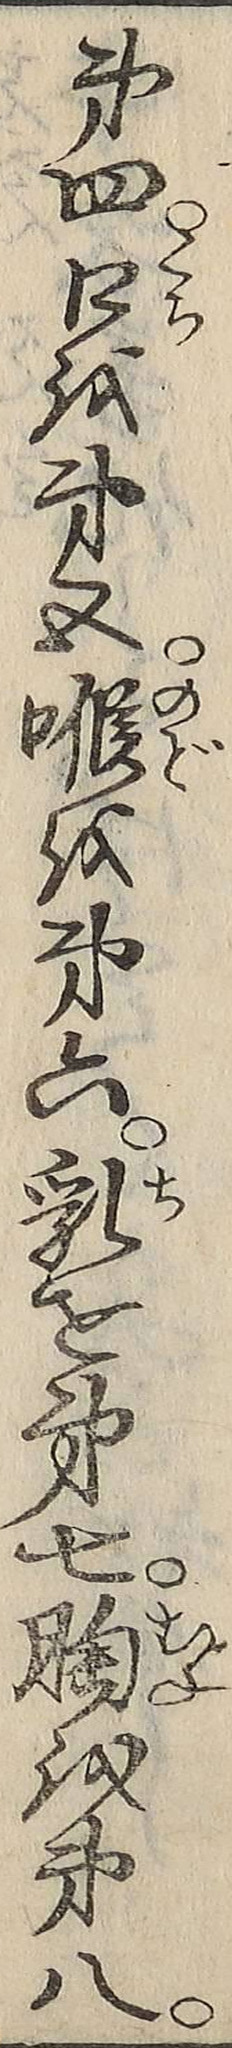第四。口を第五。喉を第六。乳を第七。胸を第八。
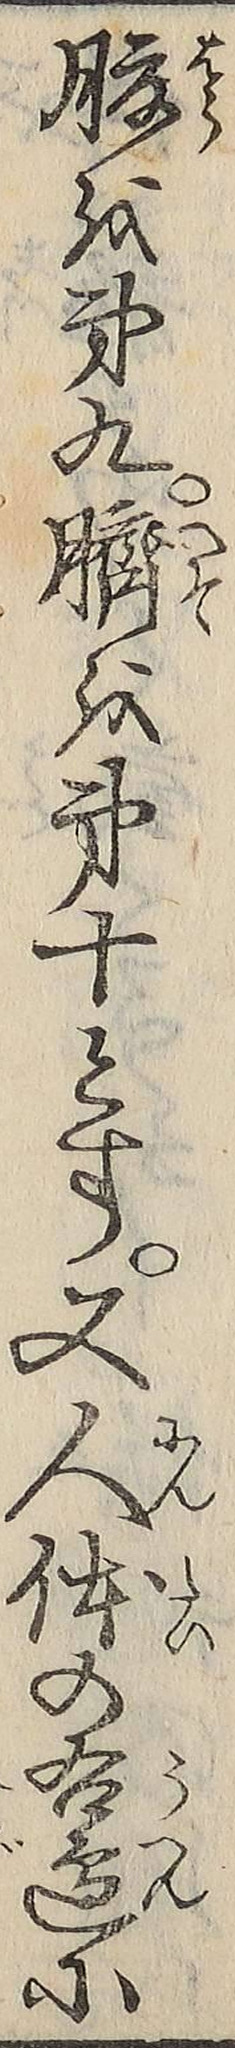腹を第九。臍を第十とす。又人体の右辺に
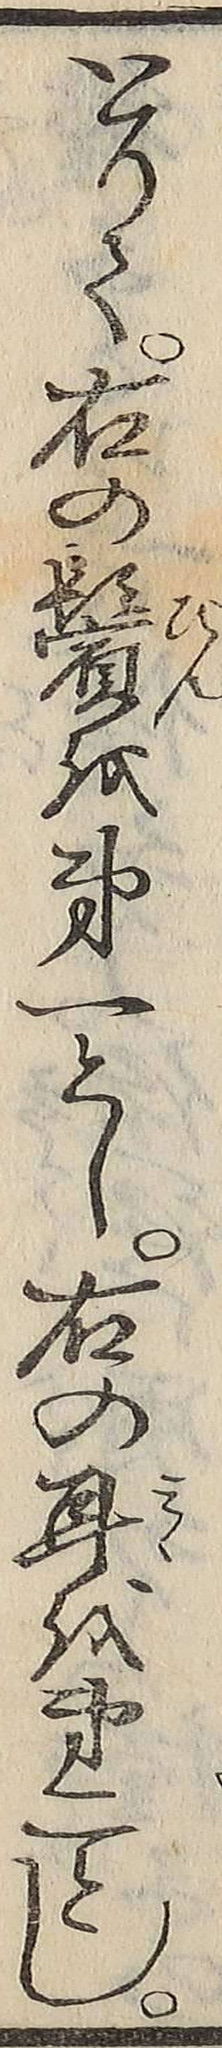とりて。右の鬢を第一とし。右の耳を第二とし。
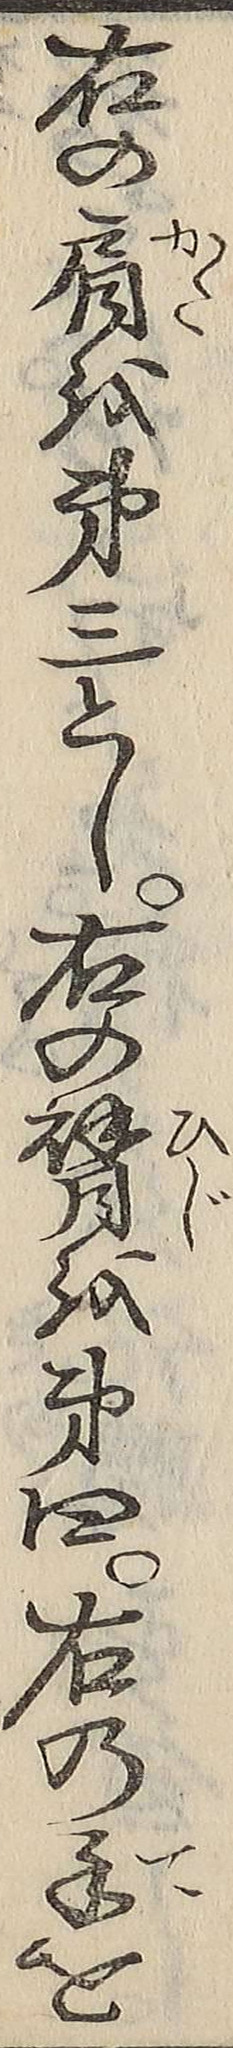右の肩を第三とし。右の臂を第四。右の手を
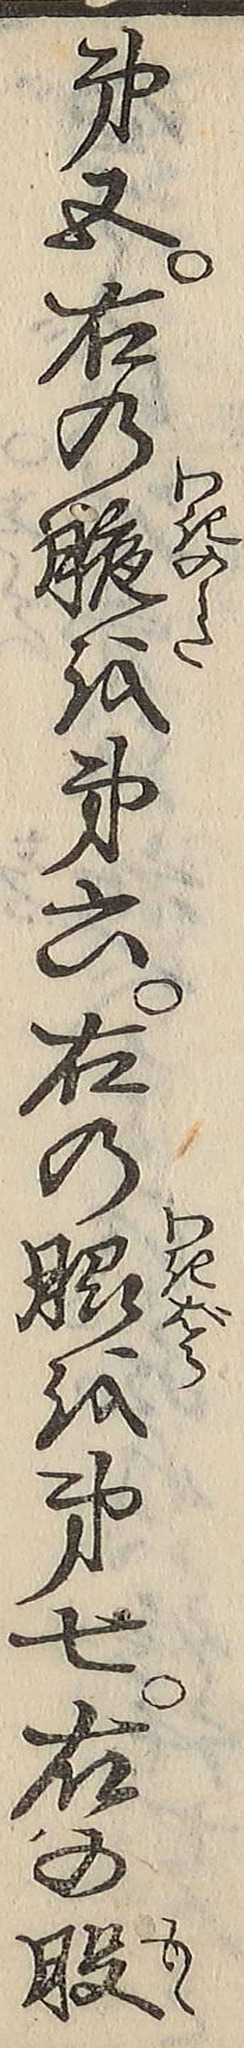第五。右の腋を第六。右の脇を第七。右の股
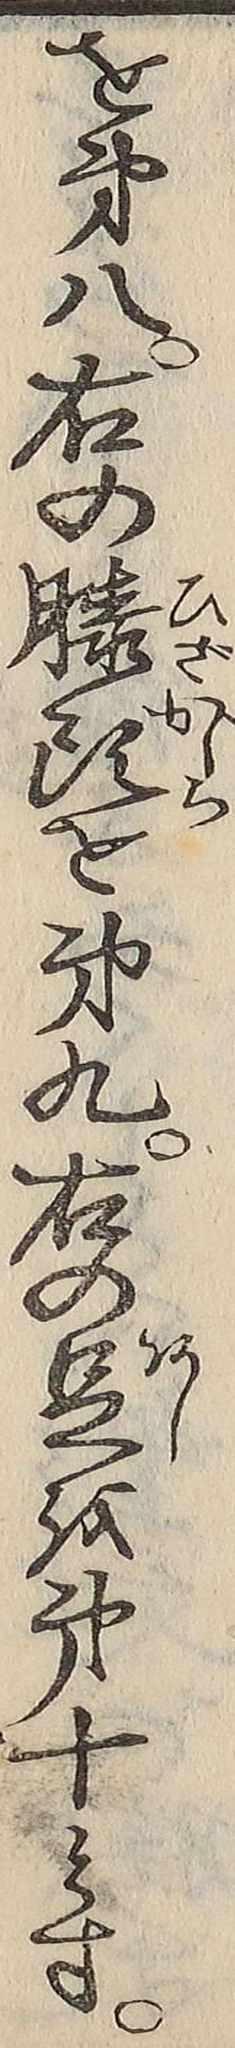を第八。右の膝頭を第九。右の足を第十とす。
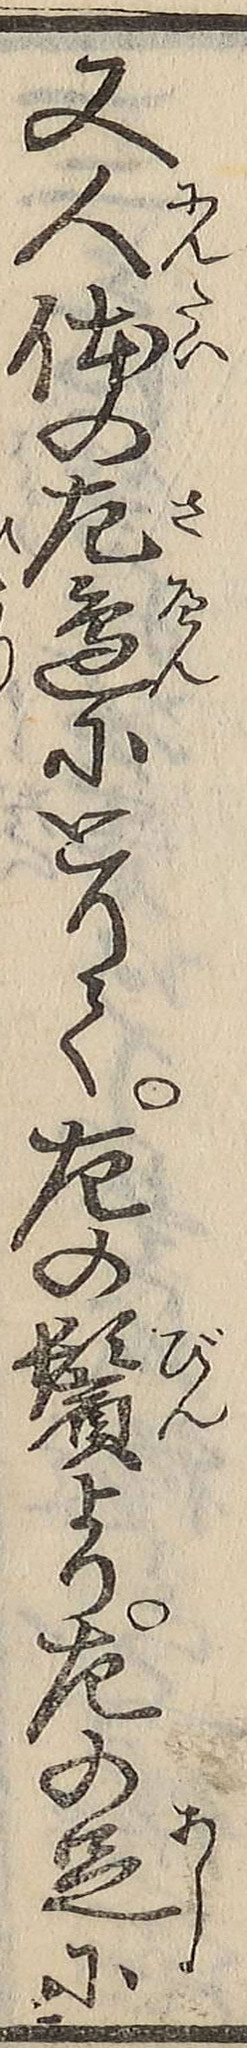又人体の左辺にとりて。左の鬢より。左の足に
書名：物覺秘傳
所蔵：神戸大学附属図書館 国文学研究資料館
